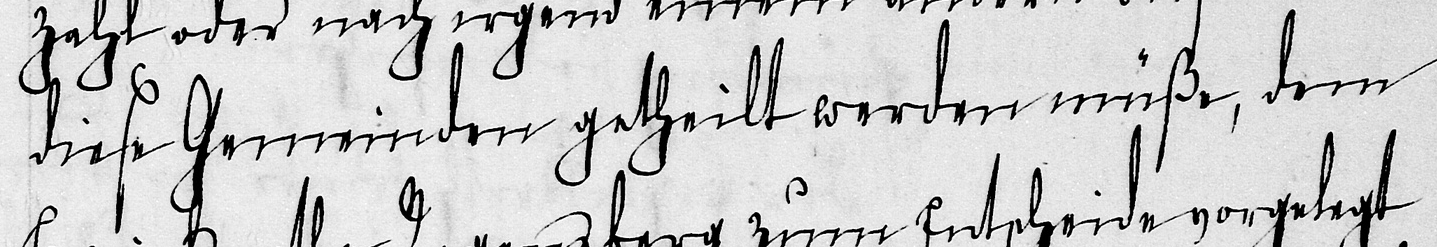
diese Gemeinden getheilt werden müße, dem
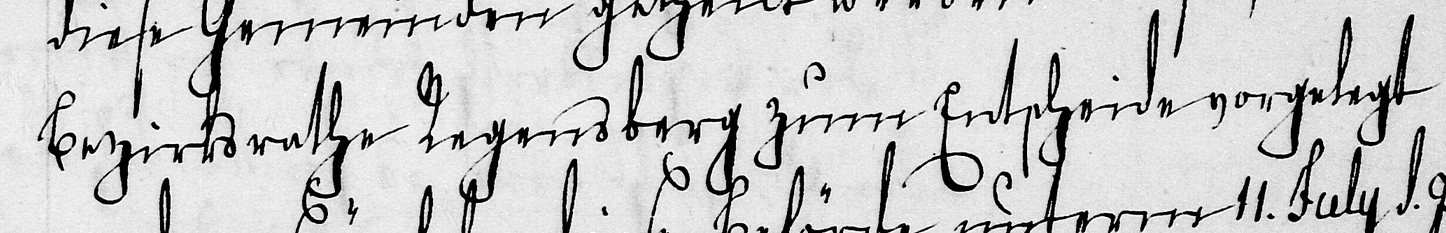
Bezirksrathe Regensberg zum Entscheide vorgelegt
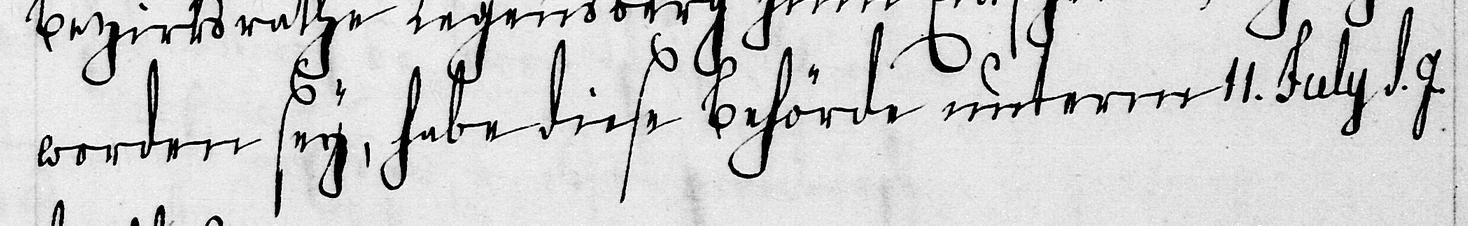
worden sey, habe diese Behörde unterm 11. July d.
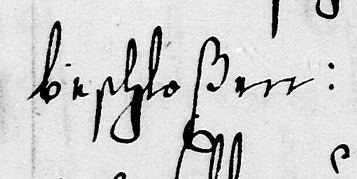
beschloßen:
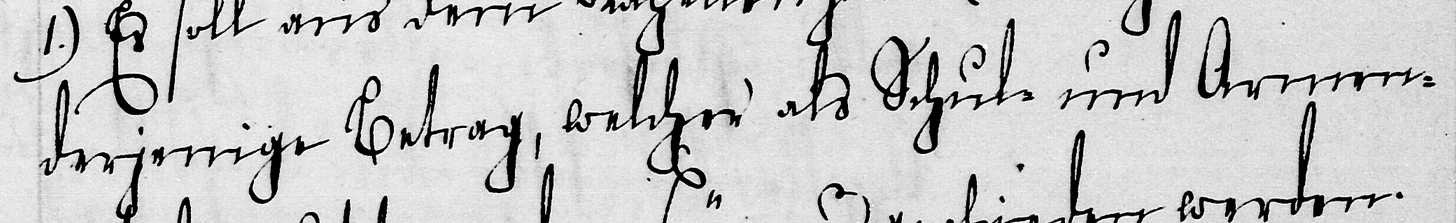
derjenige Betrag, welcher als Schul- und Armen¬
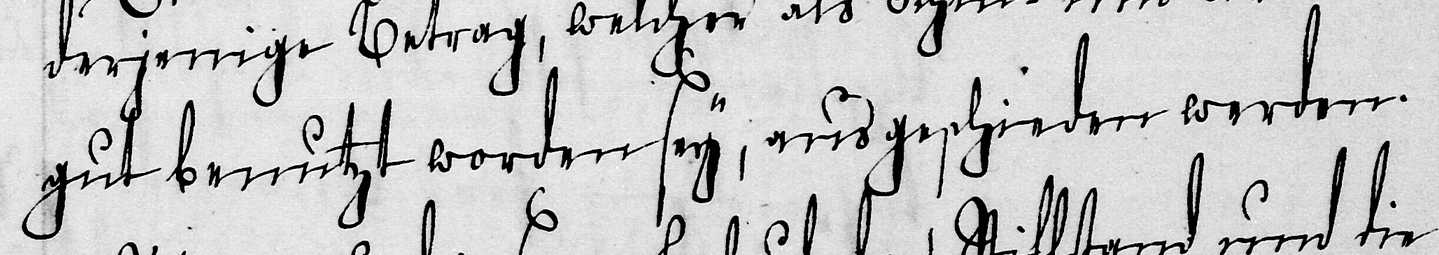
gut benutzt worden sey, ausgeschieden werden.
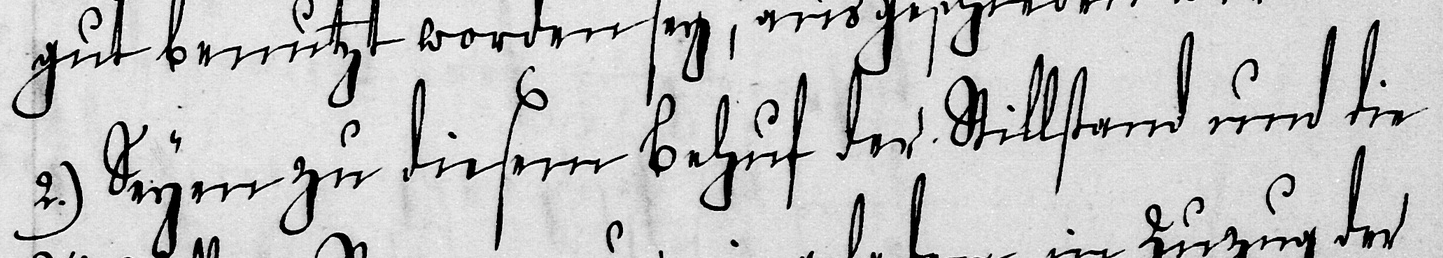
2.) Seyen zu diesem Behuf der Stillstand und die
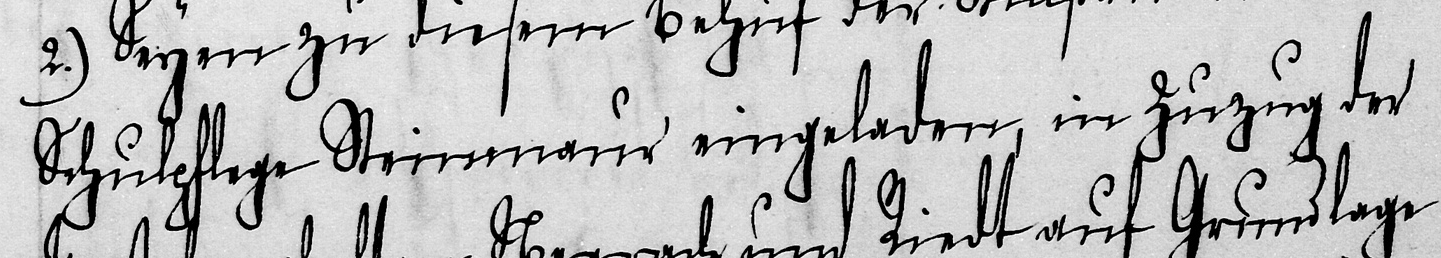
Schulpflege Steinmaur eingeladen, in Zuzug der
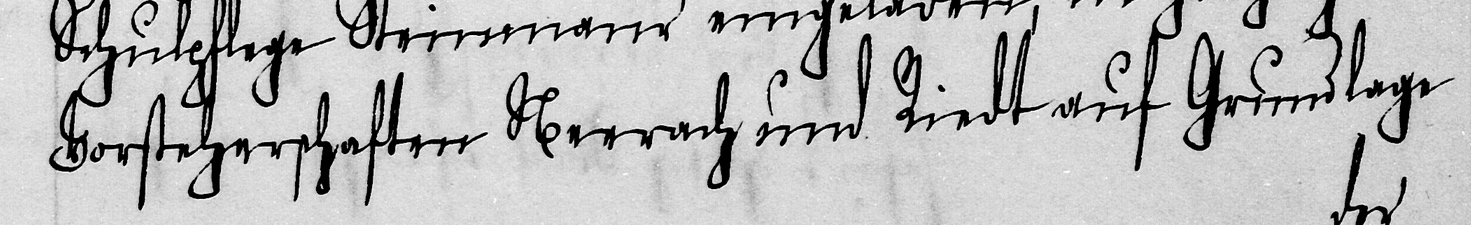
Vorsteherschaften Neerach und Riedt auf Grundlage
